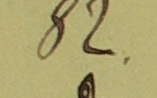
82
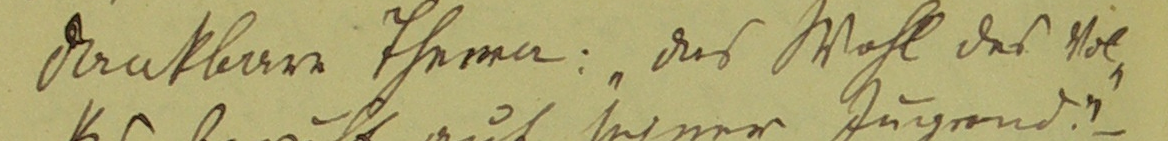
dankbare Thema:“ Das Wohl des Vol¬
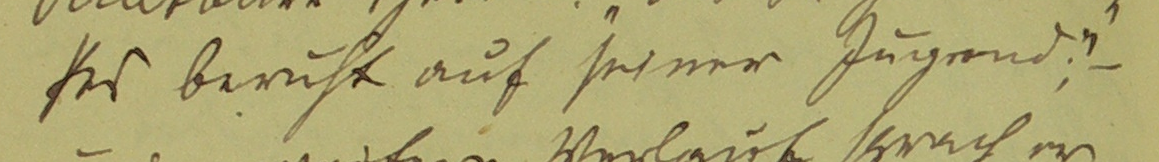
kes beruht auf seiner Jugend“;-
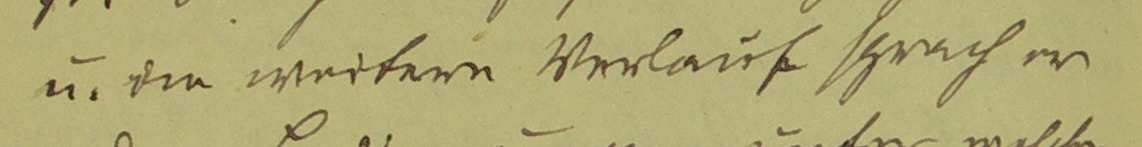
und im weiteren Verlauf sprach er
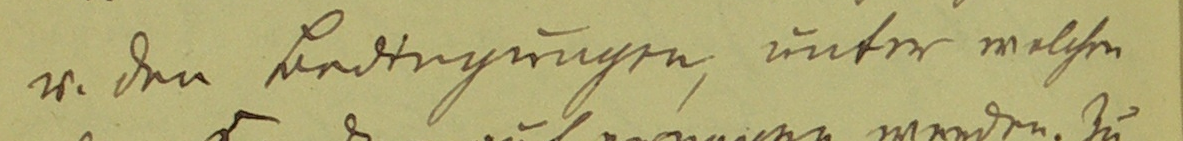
von den Bedingungen, unter welchen
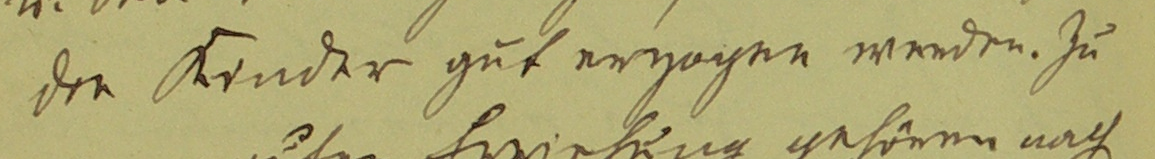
die Kinder gut erzogen werden. Zu
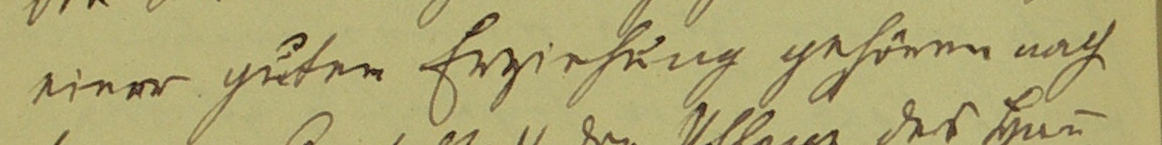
einer guten Erziehung gehören nach
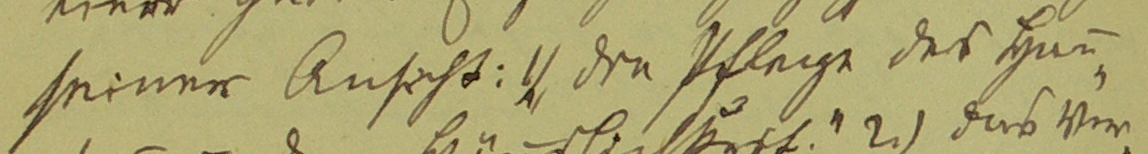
seiner Ansicht: 1) Die Pflege des Hau¬
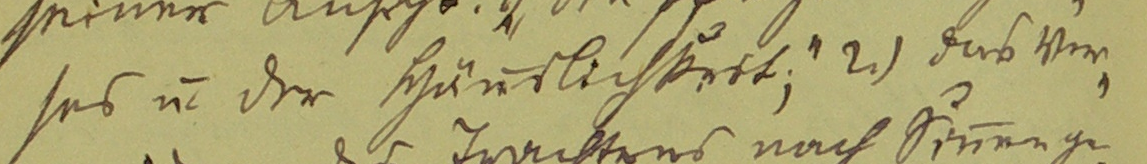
ses und der Häuslichkeit; 2) Das Ver¬
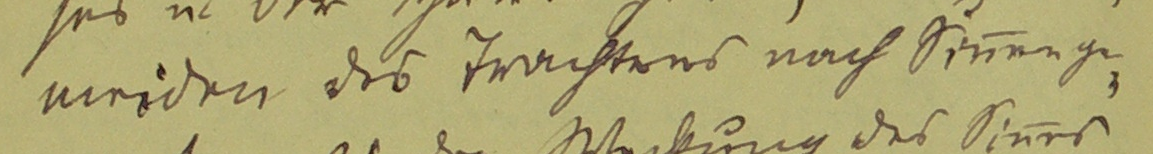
meiden des Trachtens nach Sinnenge¬
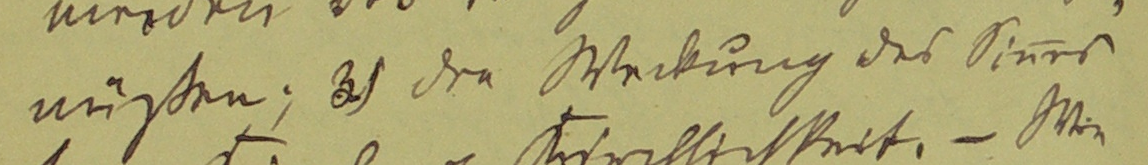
nüßen; 3) Die Weckung des Sinnes
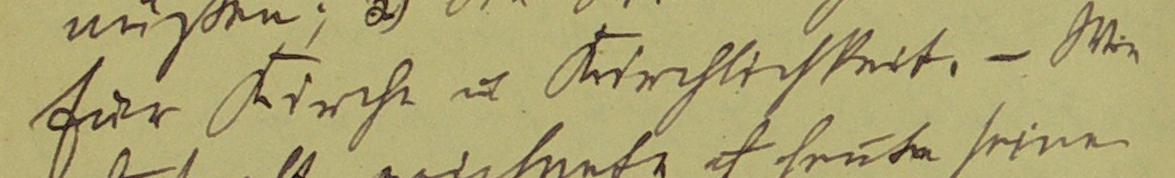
für Kirche und Kirchlichkeit. Wie
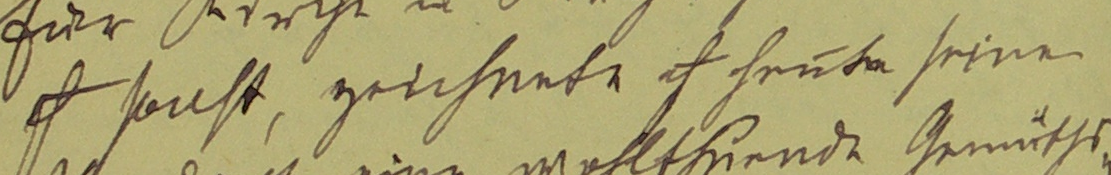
auch sonst, zeichnete auch heute seine
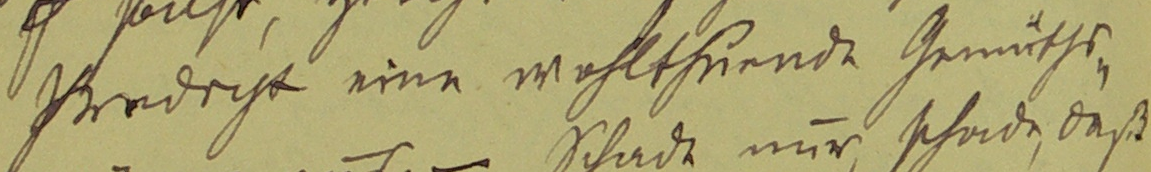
Predigt eine wohlthuende Gemüts¬
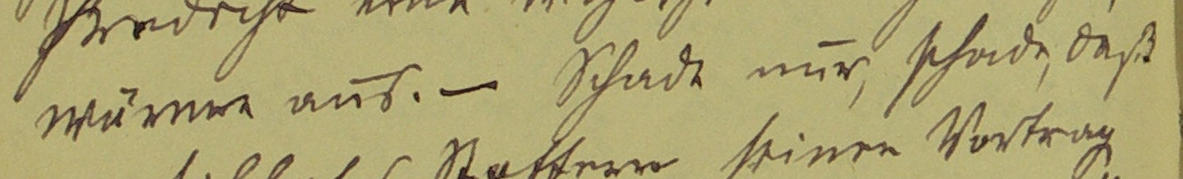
wärme aus..-Schade nur, schade daß
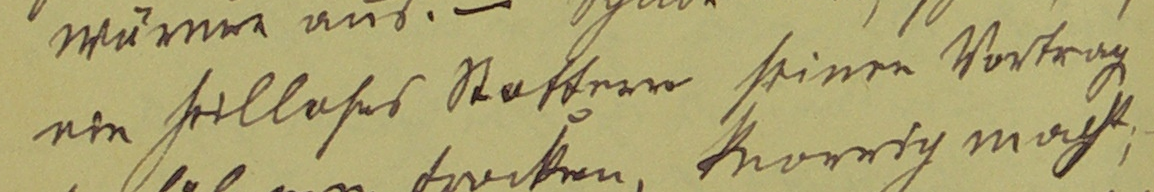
ein heilloses Stottern seinen Vortrag
